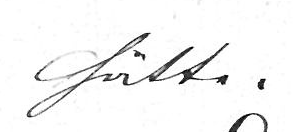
hätte.
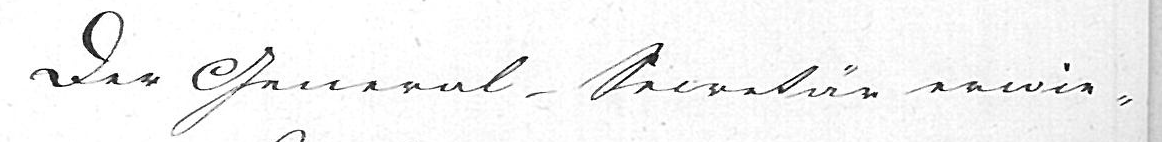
Der General-Secretär erwie-
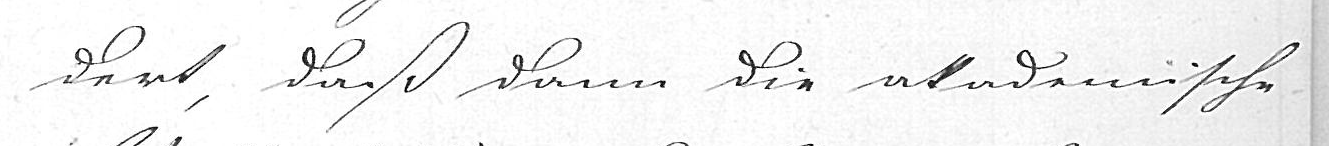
dert, daß dann die akademische
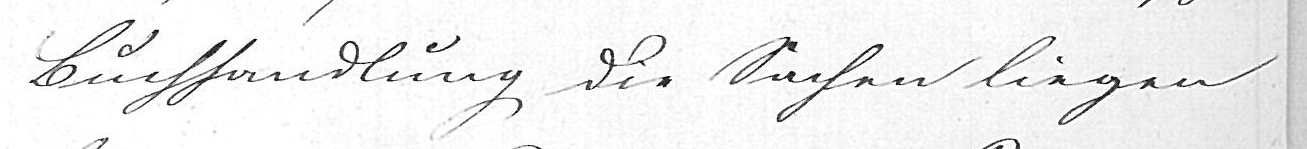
Buchhandlung die Sachen liegen
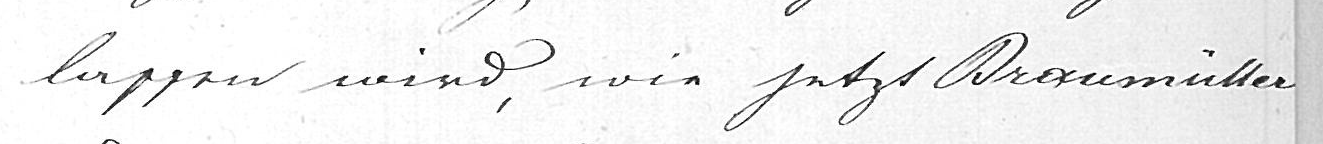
lassen wird, wie jetzt Braumüller
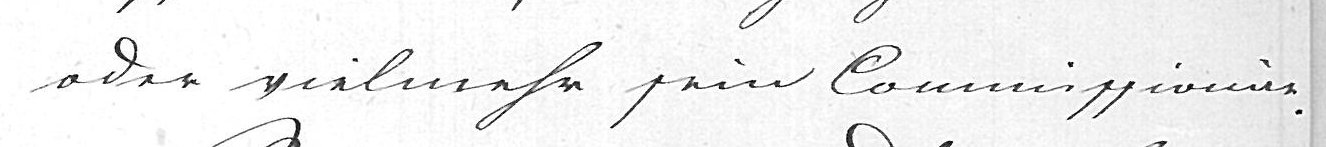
oder vielmehr sein Commissionär.
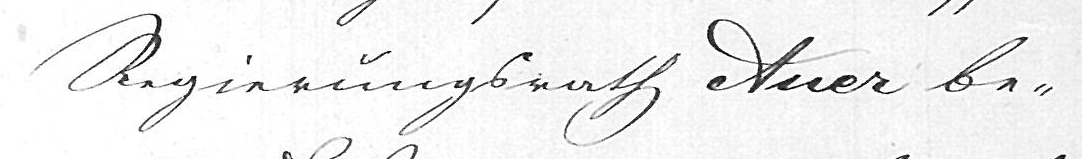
Regierungsrath Auer be-
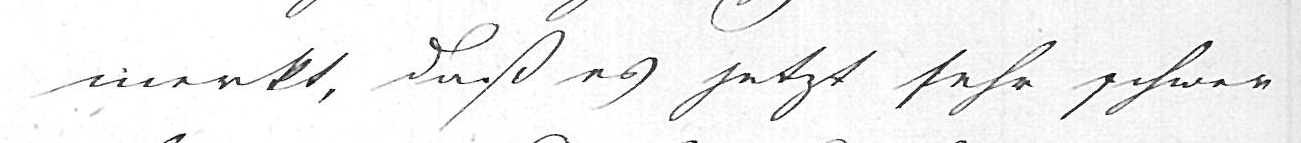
merkt, daß es jetzt sehr schwer
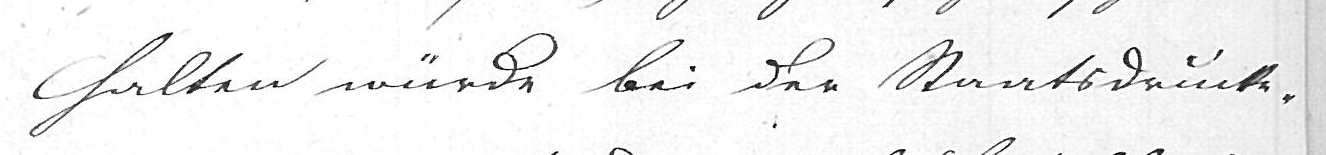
halten würde bei der Staatsdrucke-
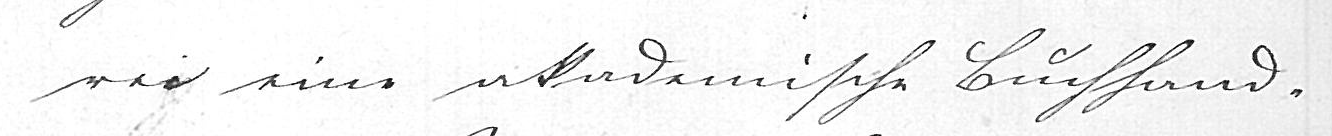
rei eine akademische Buchhand-
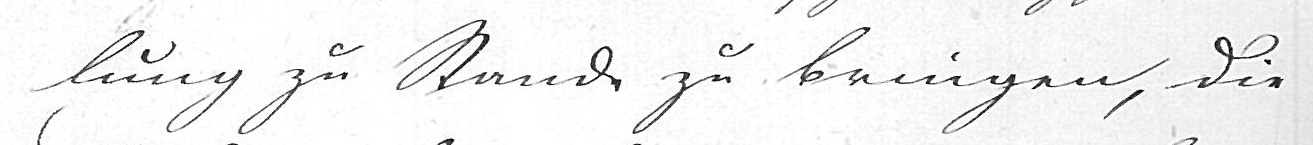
lung zu Stande zu bringen, die
